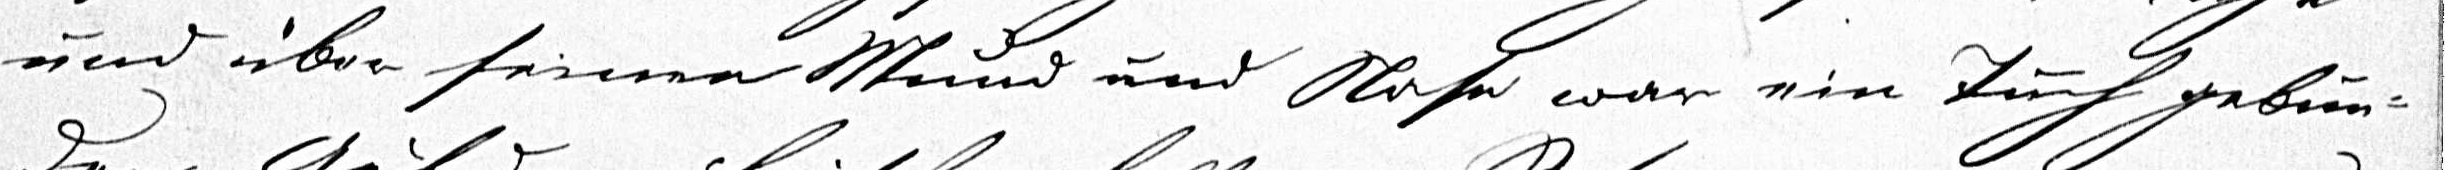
und über seinen Mund und Nase war ein Tuch gebun¬
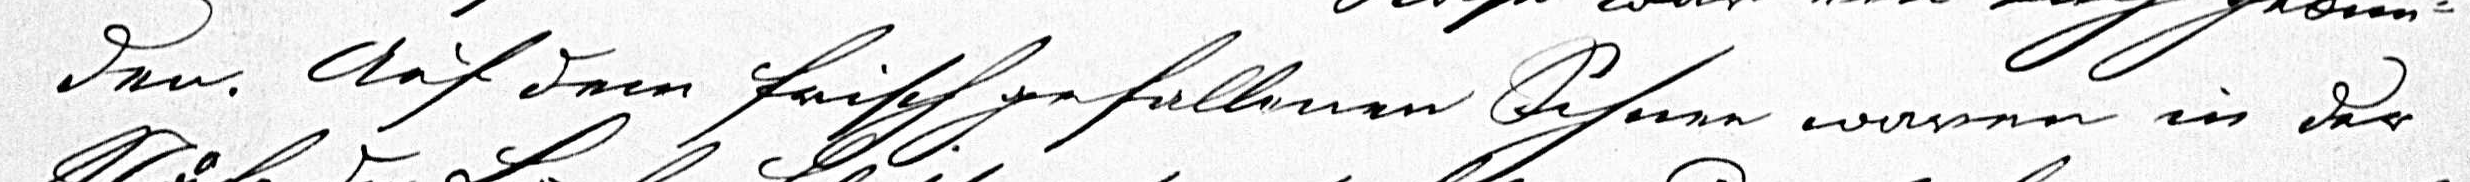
den. Auf dem frisch gefallenen Schnee waren in der
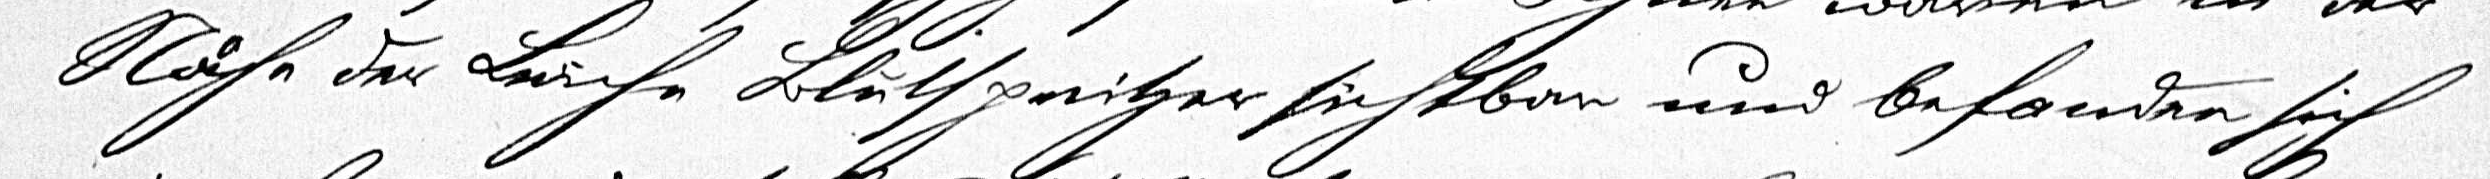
Nähe der Leiche Blutspritzer sichtbar und befanden sich
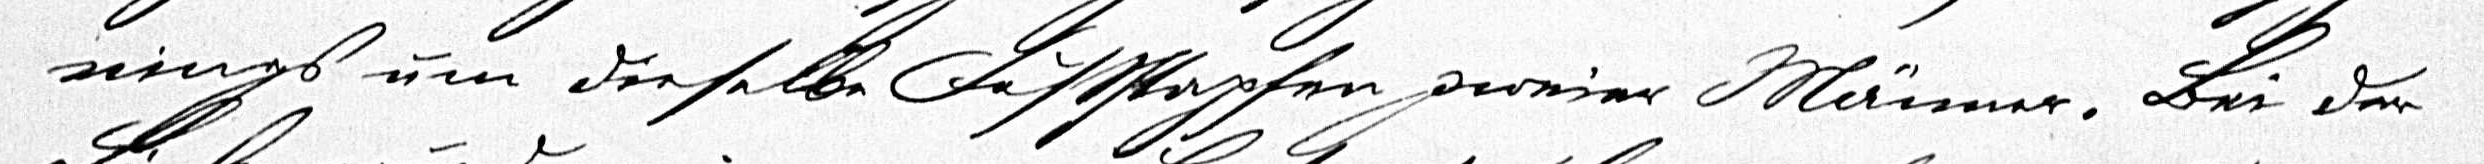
eines um dieselbe Fußstapfen zweier Männer. Bei der
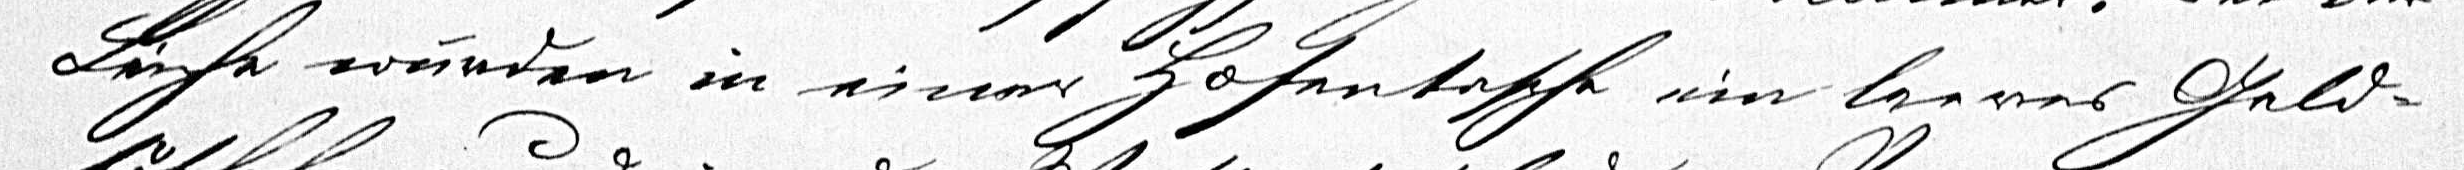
Leiche wurden in einer Hosentasche ein leeres Geld¬
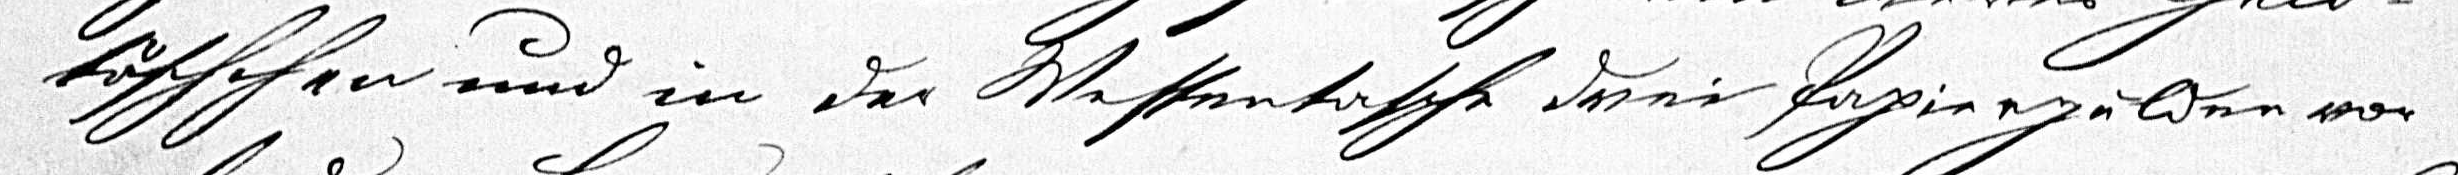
täschen und in der Westentasche drei Papiergulden vor¬
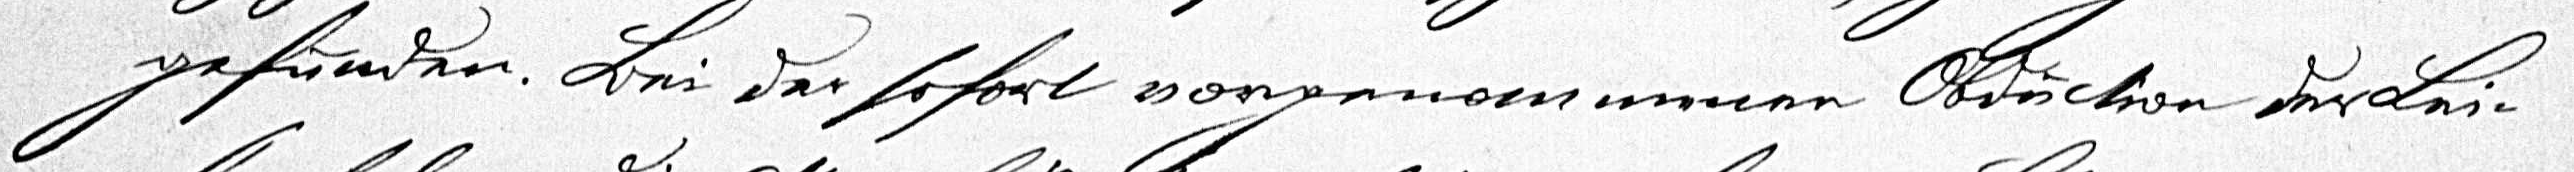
gefunden. Bei der sofort vorgenommenen Obduction der Lei¬
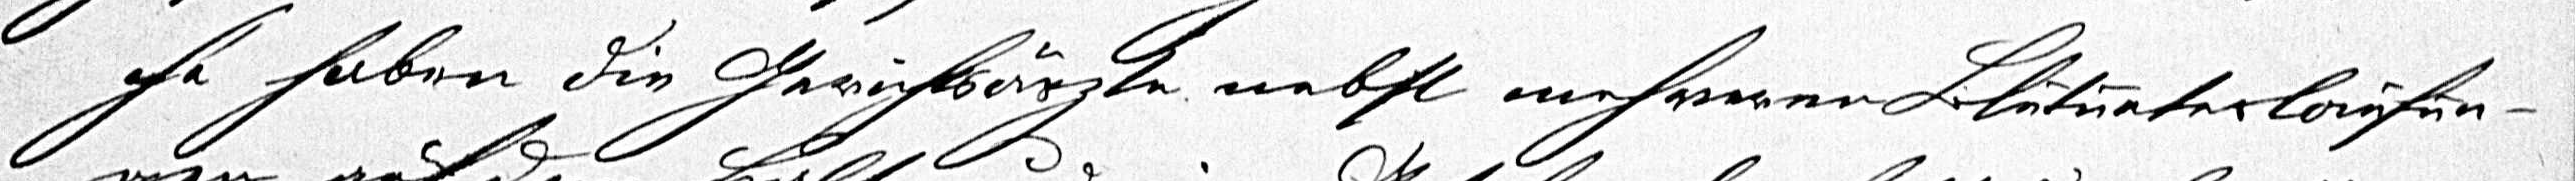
che haben die Gerichtsärzte nebst mehreren Blutunterlaufen¬
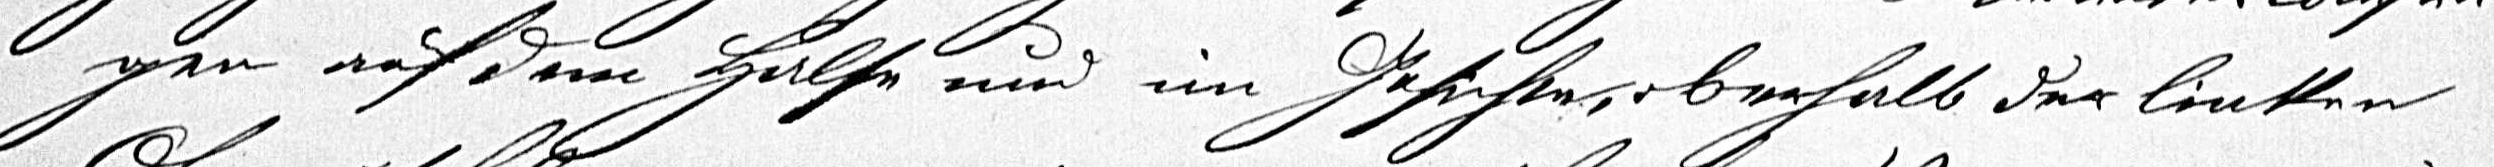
gen auf dem Halse und im Gesichte, oberhalb der linken
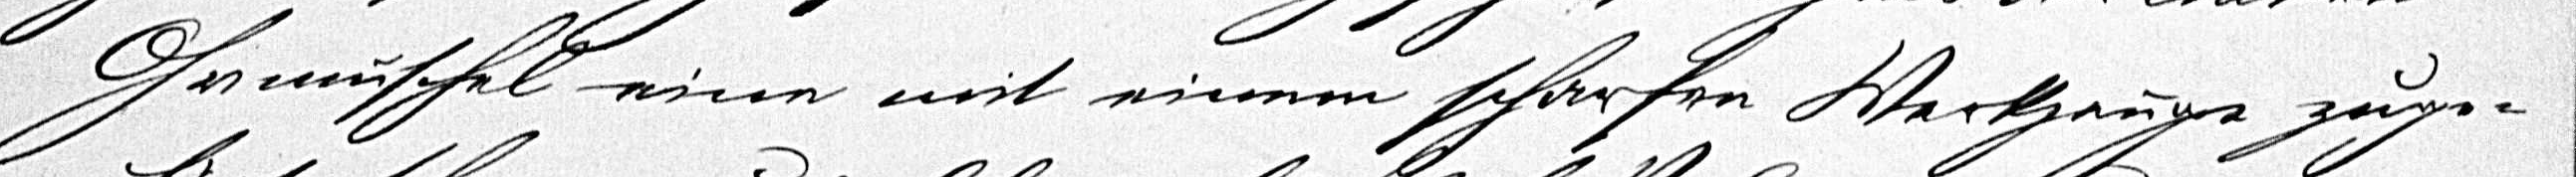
Ohrmuschel eine mit einem scharfen Werkzeuge zuge¬
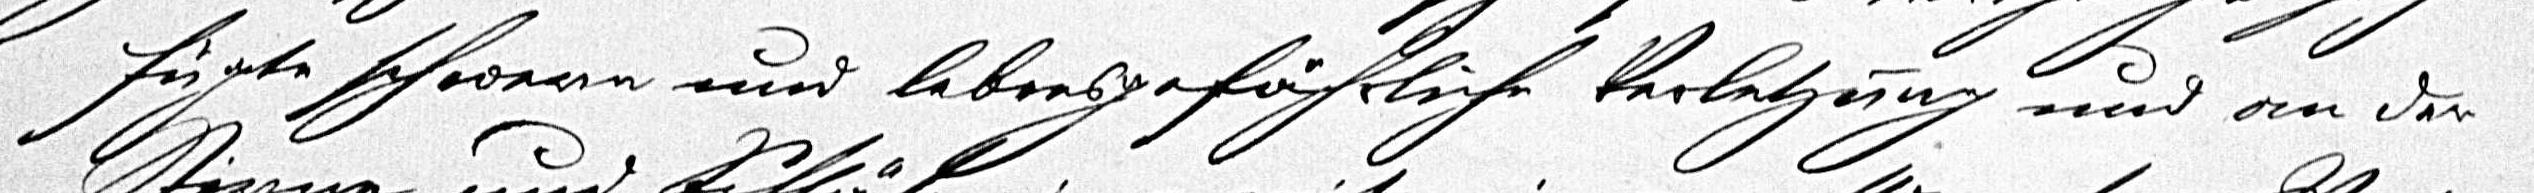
fügte schwere und lebensgefärliche Verletzung und an der
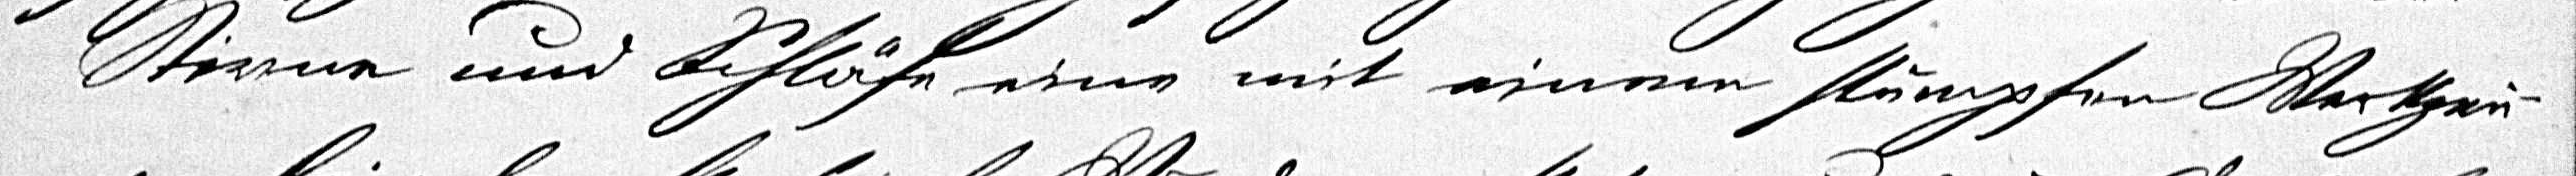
Stirne und Schläfe eine mit einem stumpfen Werkzeu¬
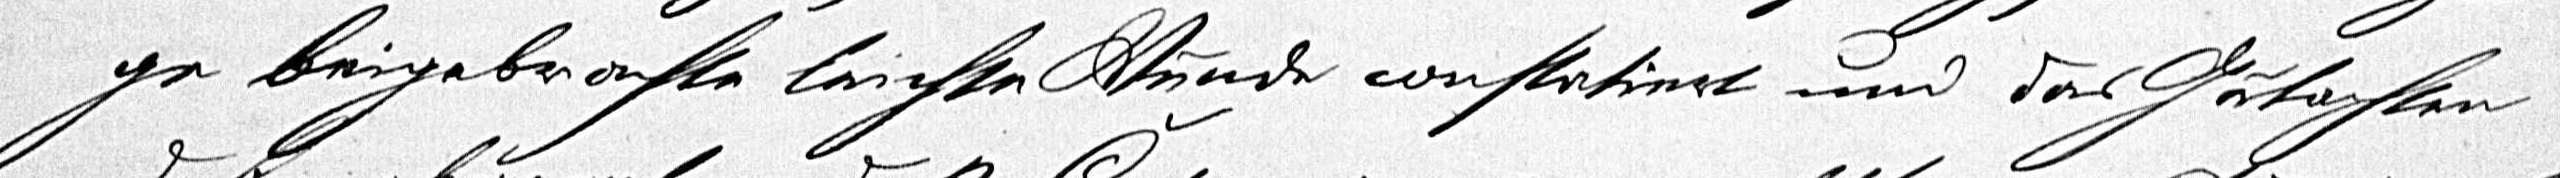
ge beigebrachte leichte Wunde constatiert und das Gutachten
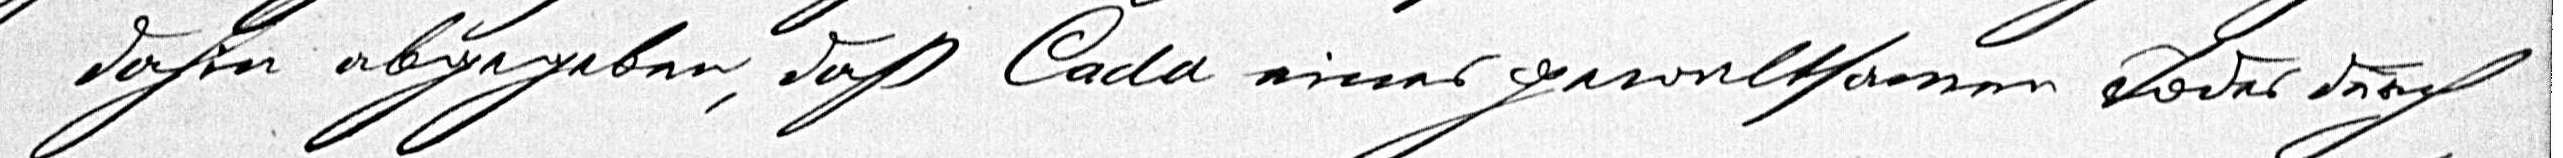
dahin abgegeben, daß Čada eines gewaltsamen Todes durch
